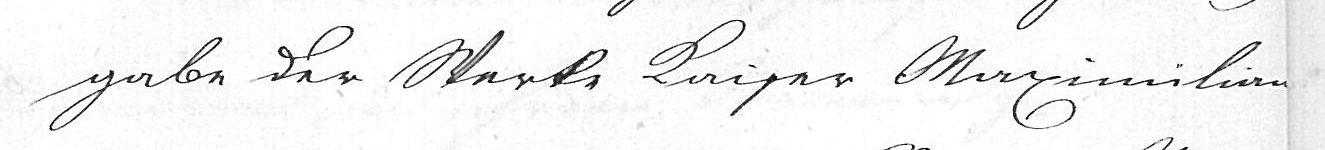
gabe der Worte Kaiser Maximilian
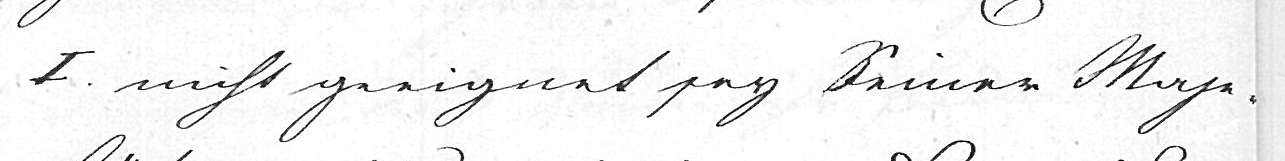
I. nicht geeignet sey Seiner Maje-
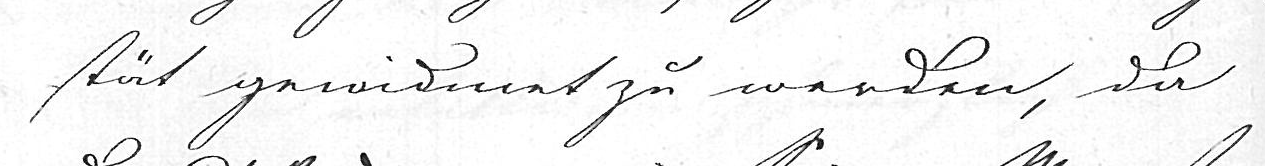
stät gewidmet zu werden, da
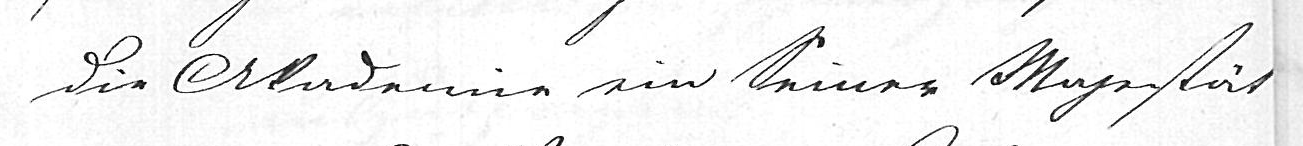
die Akademie ein Seiner Majestät
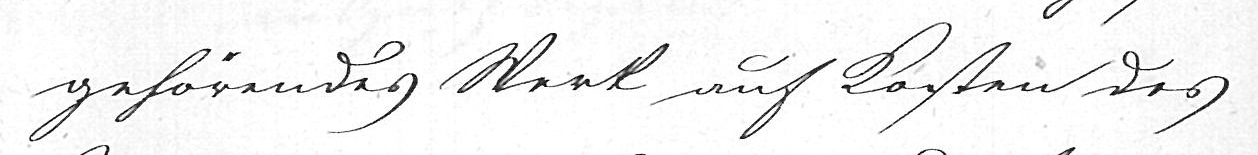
gehörendes Wort auf Kosten des
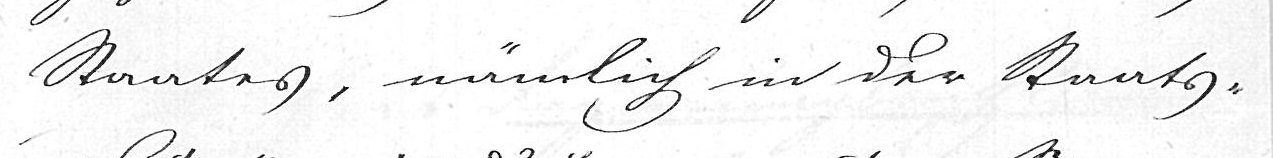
Staates, nämlich in der Staats-
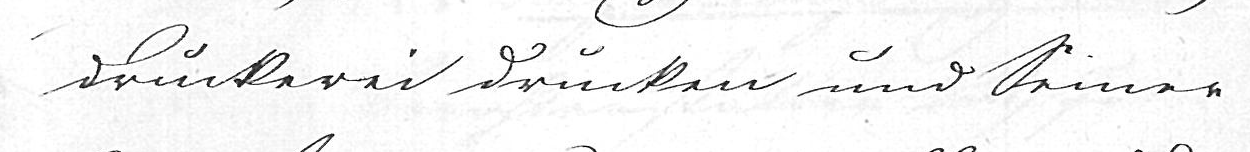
druckerei drucken und Seiner
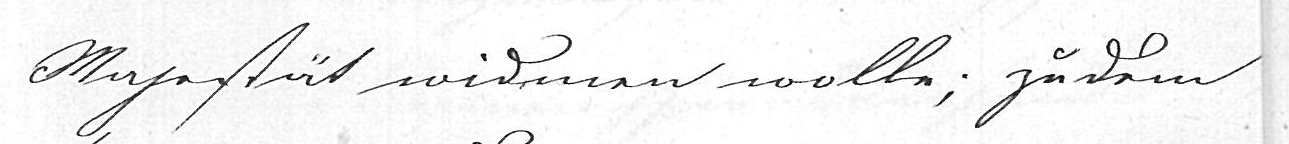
Majestät widmen wolle; zudem
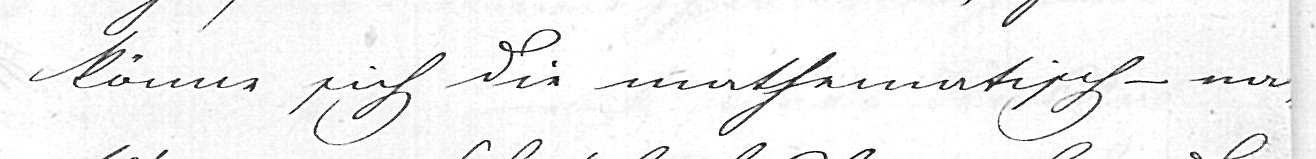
könne sich die mathematisch-na
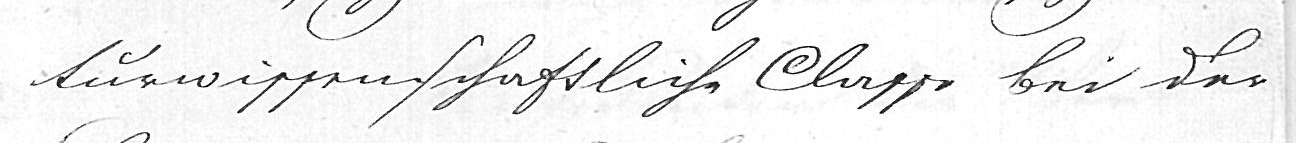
turwissenschaftliche Classe bei der
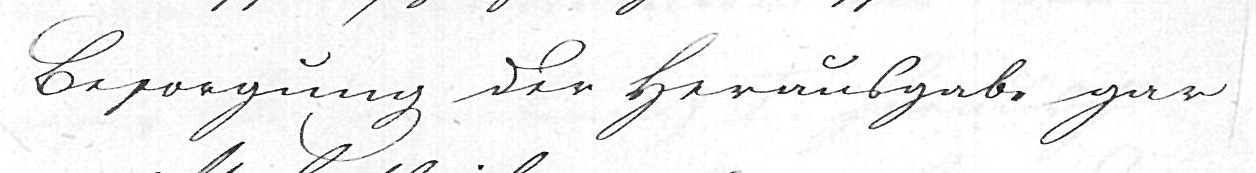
Besorgung der Herausgabe gar
